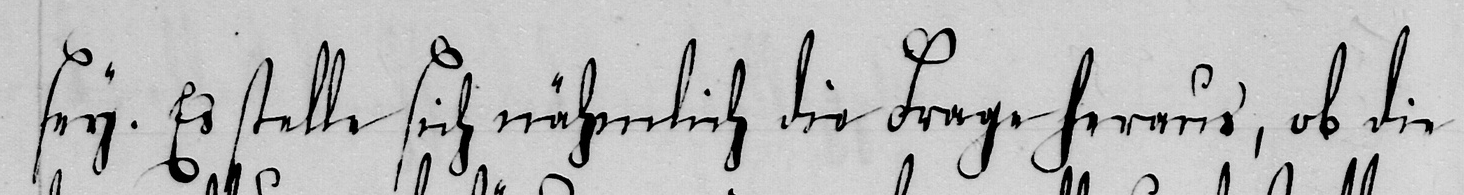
sey. Es stelle sich nähmlich die Frage heraus, ob die
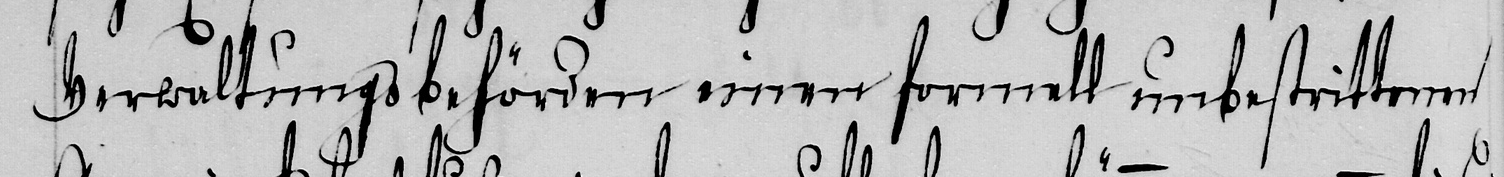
Verwaltungsbehörden einen formell unbestrittenen
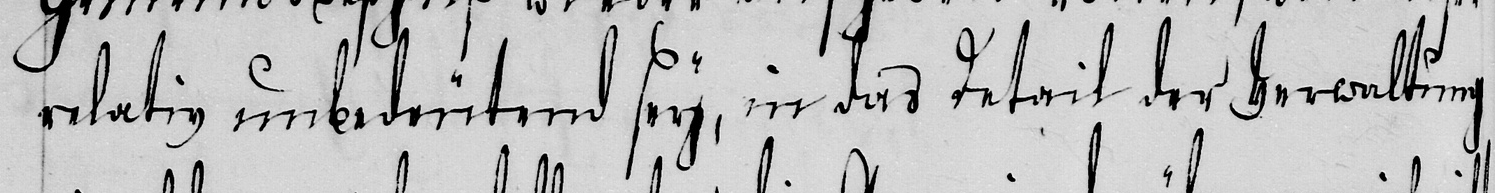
relativ unbedeutend sey, in das Detail der Verwaltung
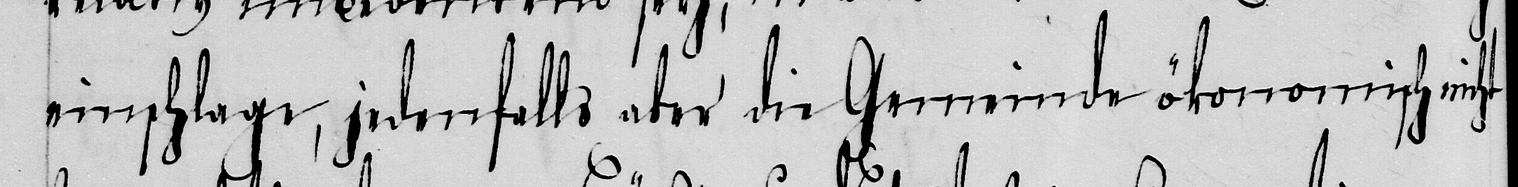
einschlage, jedenfalls aber die Gemeinde ökonomisch ni¬
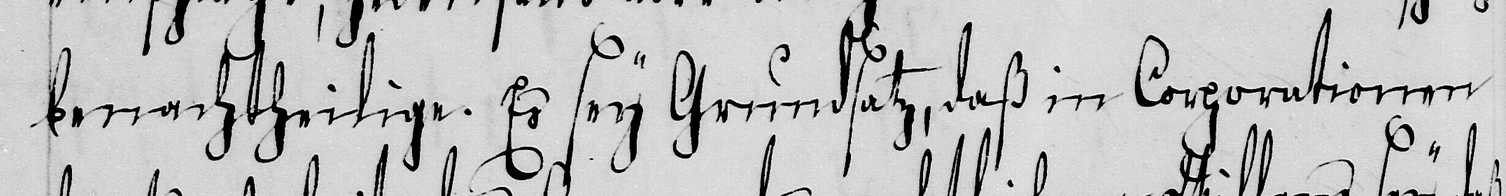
benachtheilige. Es sey Grundsatz, daß in Corporationen
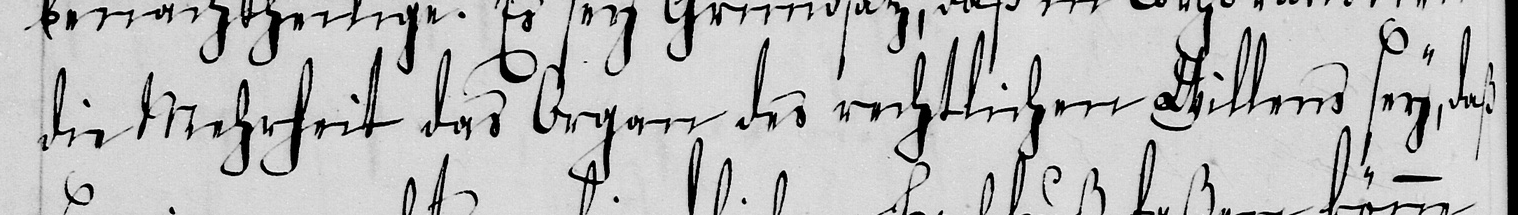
die Mehrheit das Organ des rechtlichen Willens sey, d¬
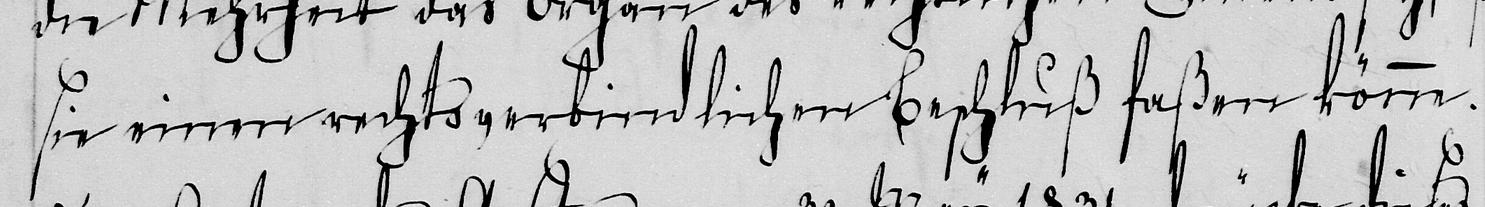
sie einen rechtsverbindlichen Beschluß faßen könne.
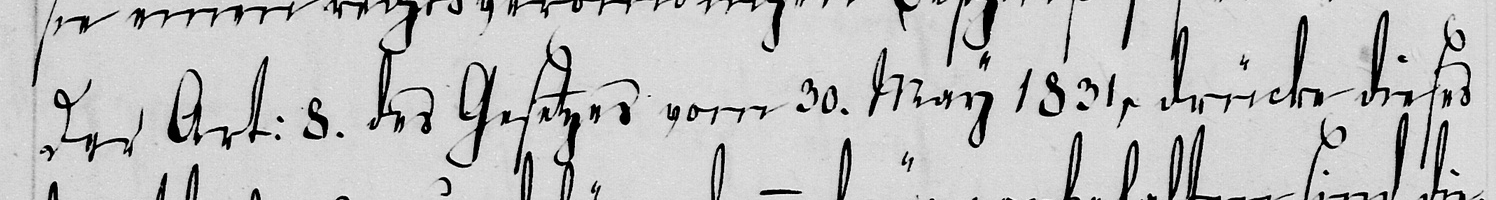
Der Art: 8. des Gesetzes vom 30. May 1831, drücke dieses
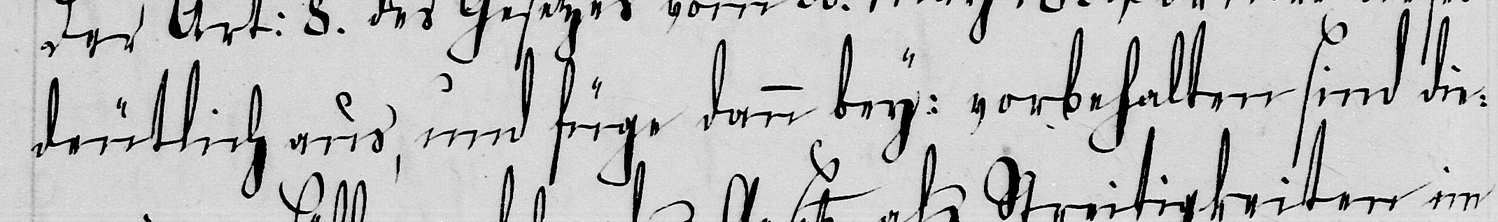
deutlich aus, und füge dann bey: vorbehalten sind di¬
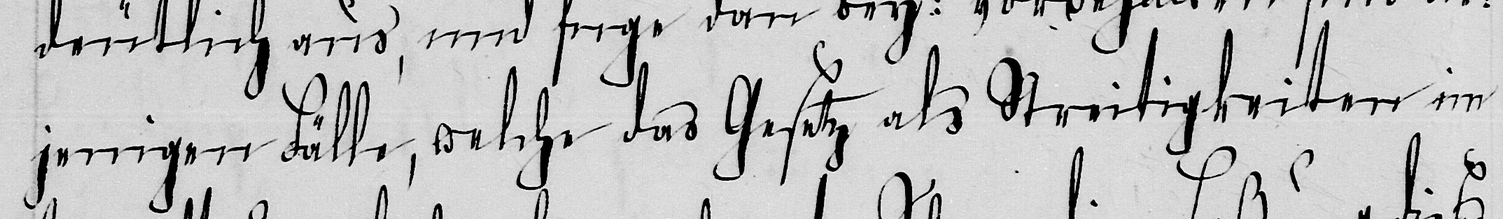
ejenigen Fälle, welche das Gesetz als Streitigkeiten im
